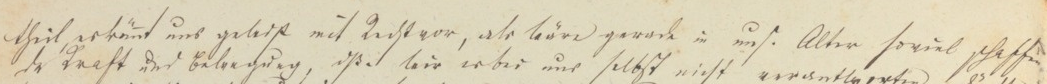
theil, es kömmt uns gewiß mit Recht vor, als wäre gerade in uns. Alter soviel schaffen-
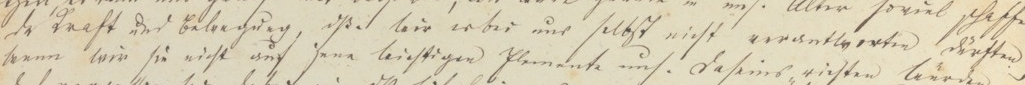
de Kraft und Bewegung, dß. wir es bei uns selbst nicht verantworten dürften,
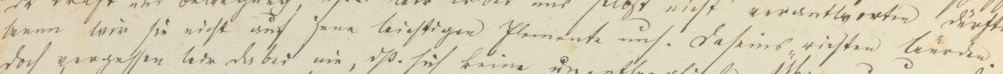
wenn wir sie nicht auf jene wichtigen Elemente uns. Daseins richten würden.
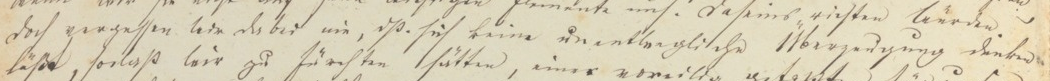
Doch vergessen wir dabei nie, dß. sich keine unentwegliche Überzeugung denken
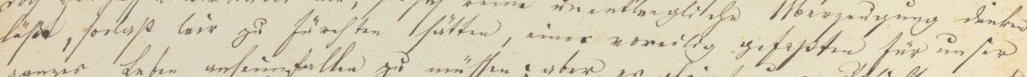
läßt, sodaß wir zu fürchten hätten, einer voreilig gefaßten für unser
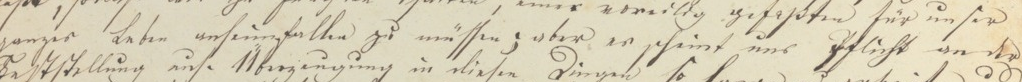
ganzes Leben anheimfallen zu müssen; aber es scheint uns Pflicht an der
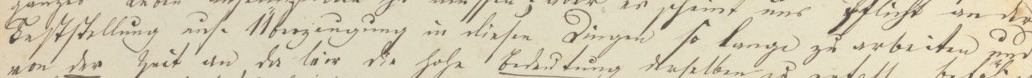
Feststellung uns. Überzeugung in diesen Dingen so lange zu arbeiten und
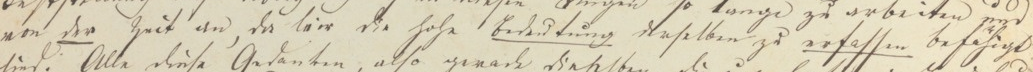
von der Zeit an, da wir die hohe Bedeutung derselben zu erfassen befähigt
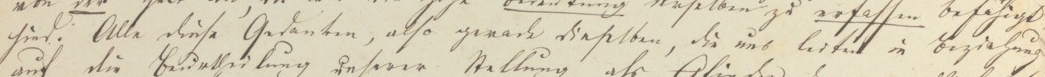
sind. Alle diese Gedanken, also gerade dieselben, die uns leiten in Beziehung
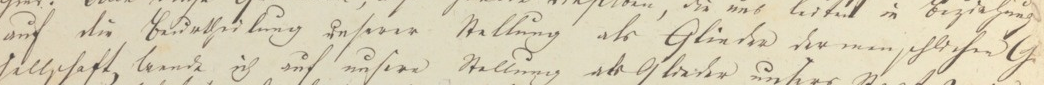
auf die Beurtheilung unserer Stellung als Glieder der menschlichen Ge-
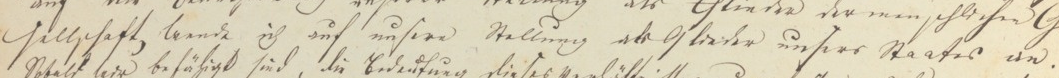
sellschaft, wende ich auf unsere Stellung als Glieder unsers Staates an.
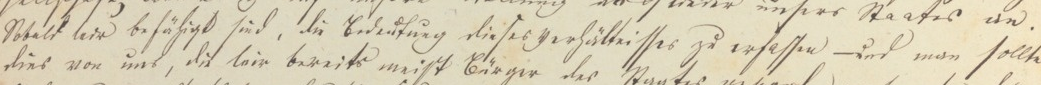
Sobald wir befähigt sind, die Bedeutung dieses Verhältnisses zu erfassen – und man sollte
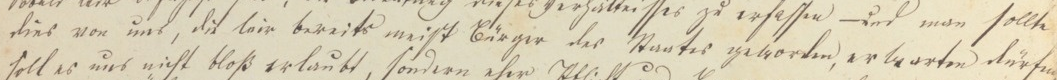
dies von uns, die wir bereits meist Bürger des Staates geworden, erwarten dürfen –
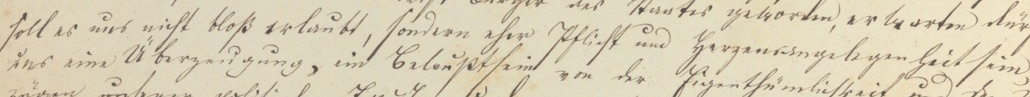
soll es uns nicht bloß erlaubt, sondern eher Pflicht und Herzensangelegenheit sein,
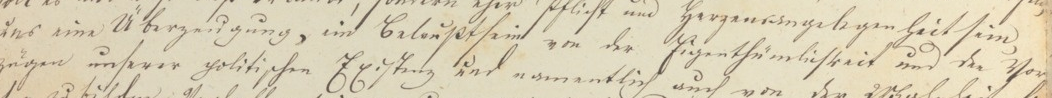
uns eine Überzeugung, ein Bewußtsein von der Eigenthümlichkeit und den Vor-
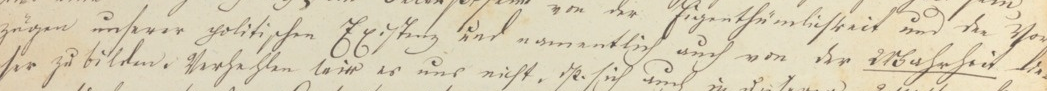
zügen unserer politischen Existenz und namentlich auch von der Wahrheit die-
